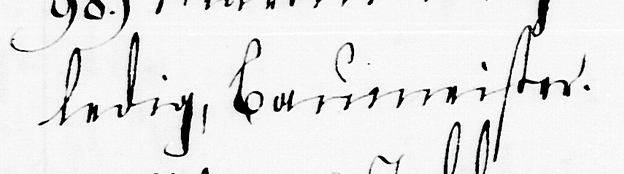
ledig, Baumeister.
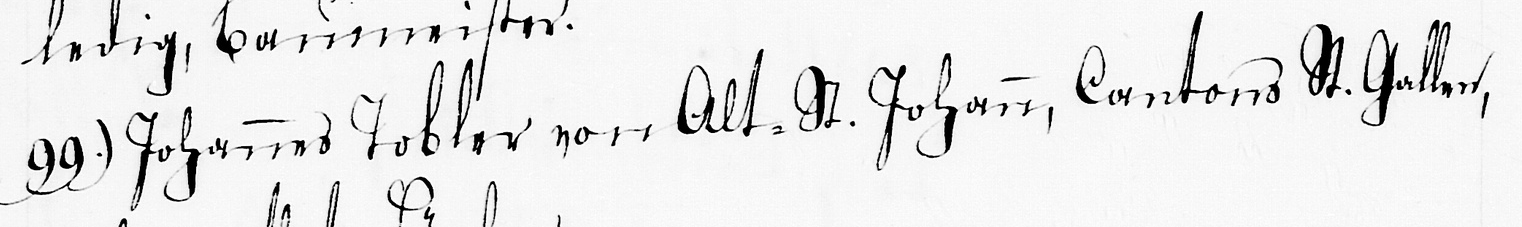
99.) Johannes Tobler von Alt-St. Johann, Cantons St. Gallen,
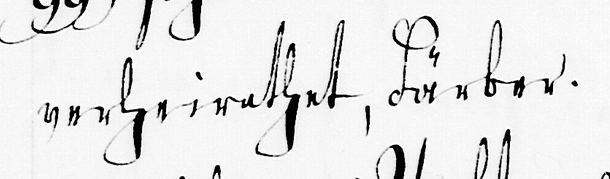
verheirathet, Färber.
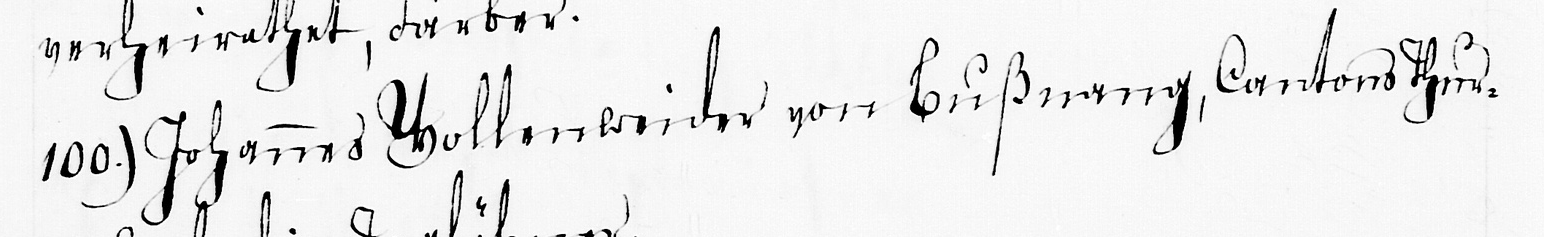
100.) Johannes Vollenweider von Bußnang, Cantons Thur¬
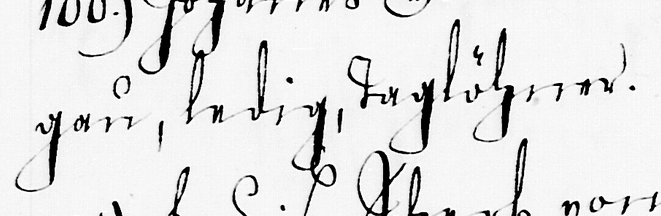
gau, ledig, Taglöhner.
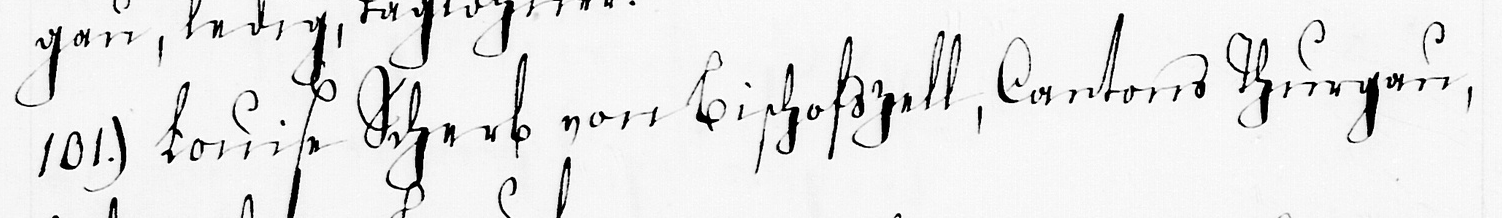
101.) Louise Scherb von Bischofszell, Cantons Thurgau,
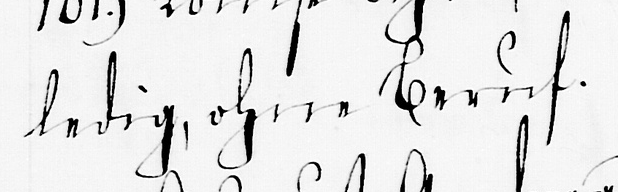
ledig, ohne Beruf.
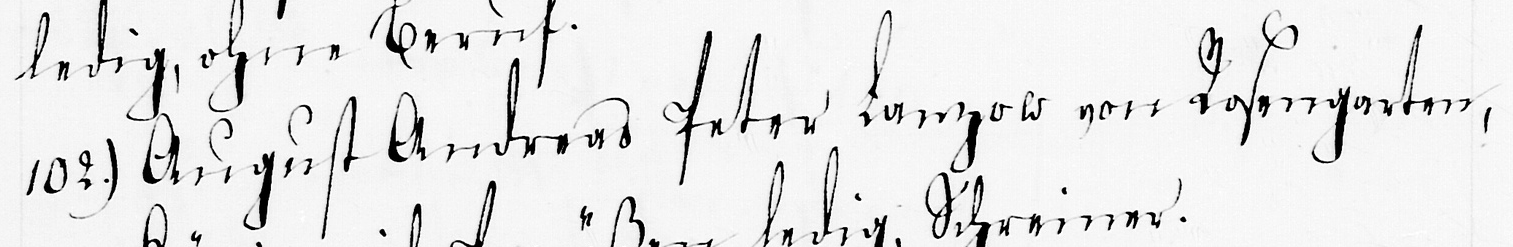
102.) August Andreas Peter Lanzow von Rosengarten,
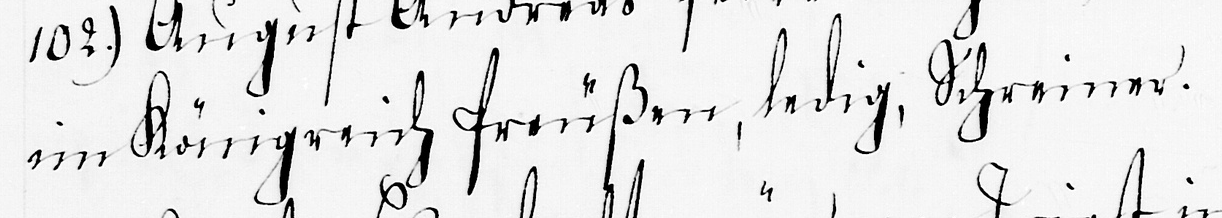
im Königreich Preußen, ledig, Schreiner.
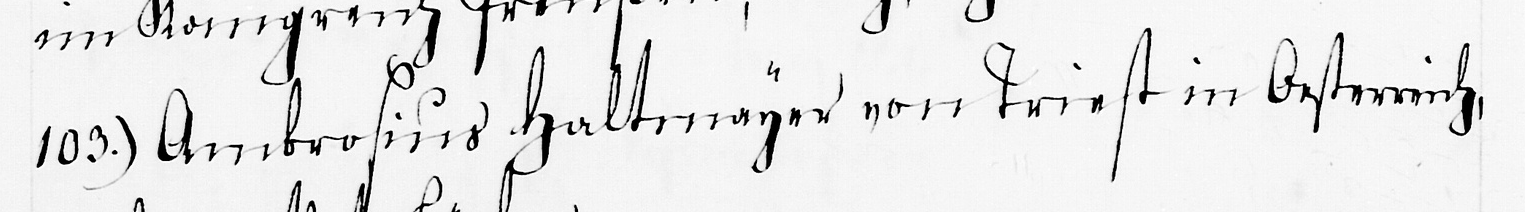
103.) Ambrosius Haltmayer von Triest in Oesterreich,
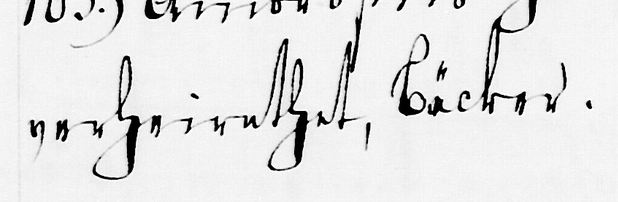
verheirathet, Bäcker.
